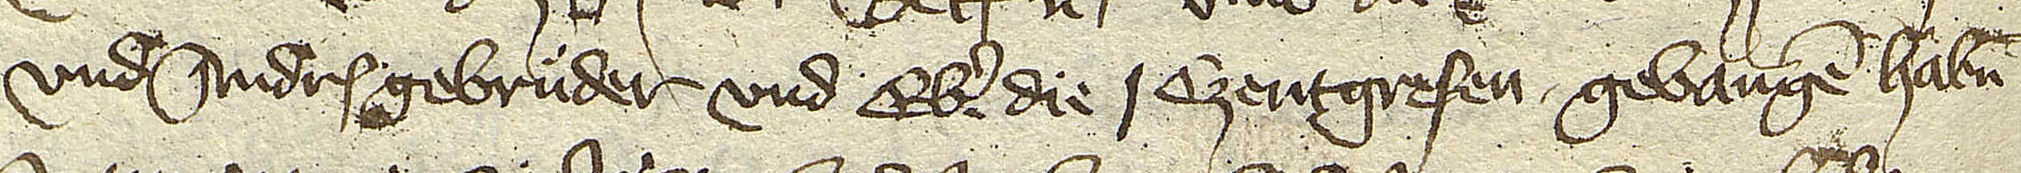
vnd Andr* gebrüder vnd Eb* die / Cʒentgrefen gevange* habn*
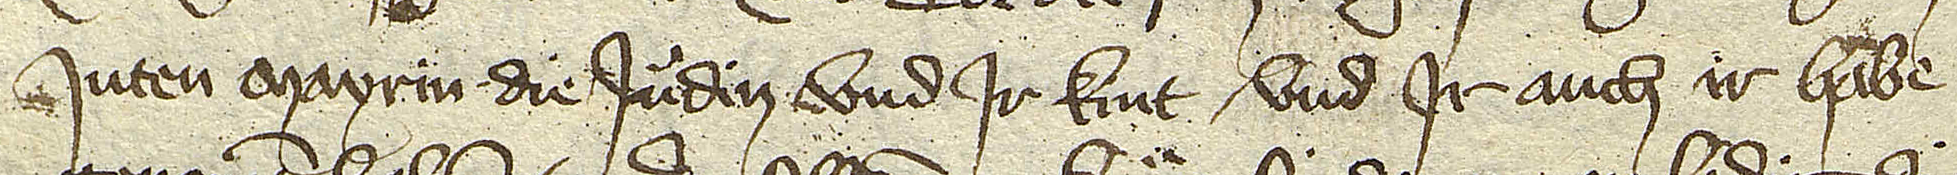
Iuten Mayrin die Iüdin / vnd Ir kint / vnd Ir auch ir habe
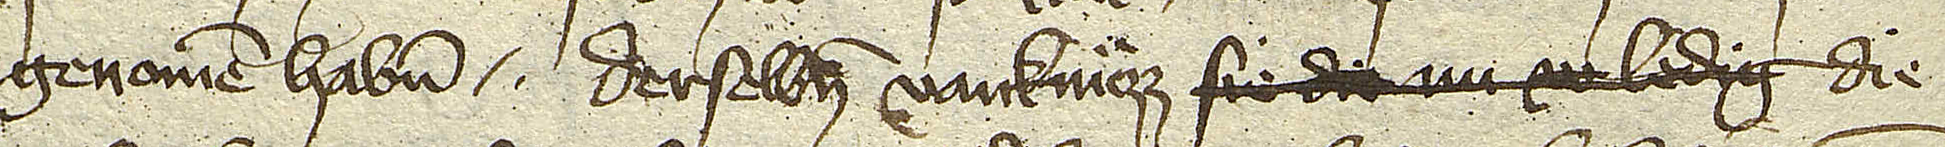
genome* habn* / . Derſelbn* vanknüʒʒ ſie die nu w ledig die
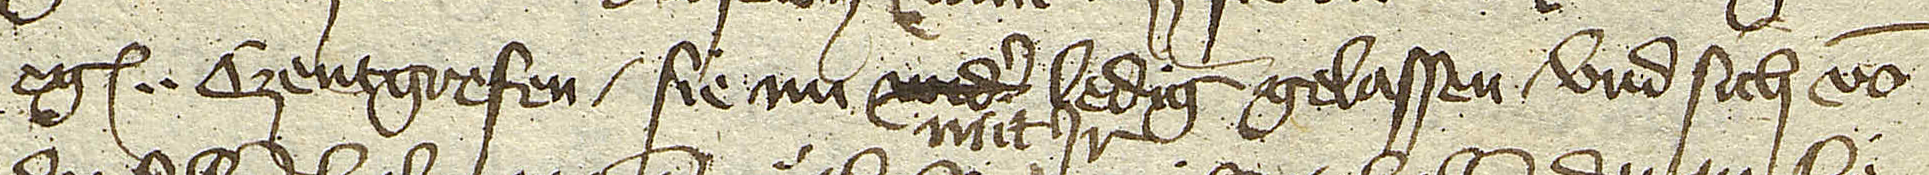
eg* ~ Cʒentgrefen / ſie nu wid* ledig gelaſſen / vnd ſich vo*
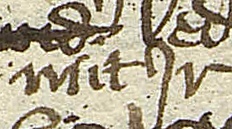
mit Ir
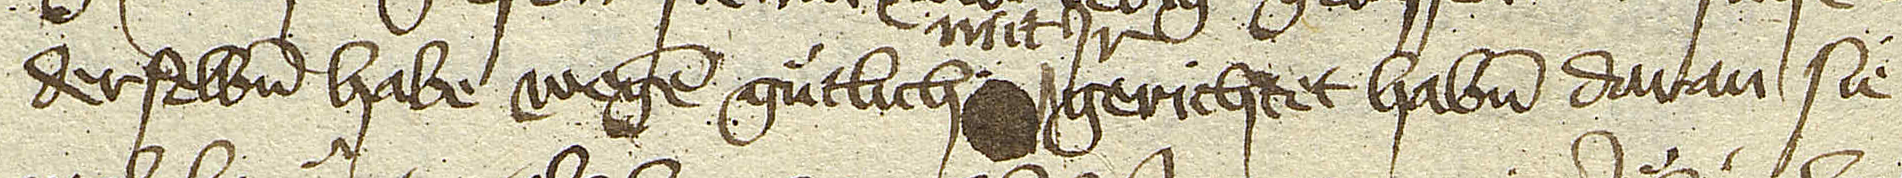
derſelbn* habe wege* gütlich gerichtet habn* daran ſie
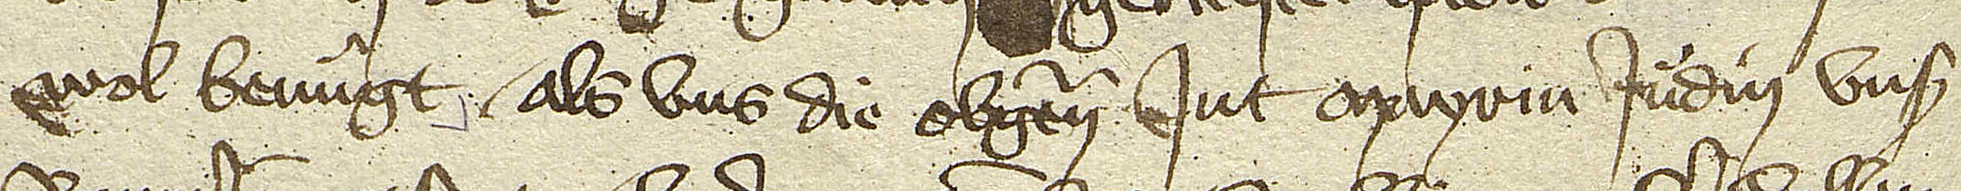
wol benügt / als vns die obgen* Iut Mayrin Iüdin vnſ*
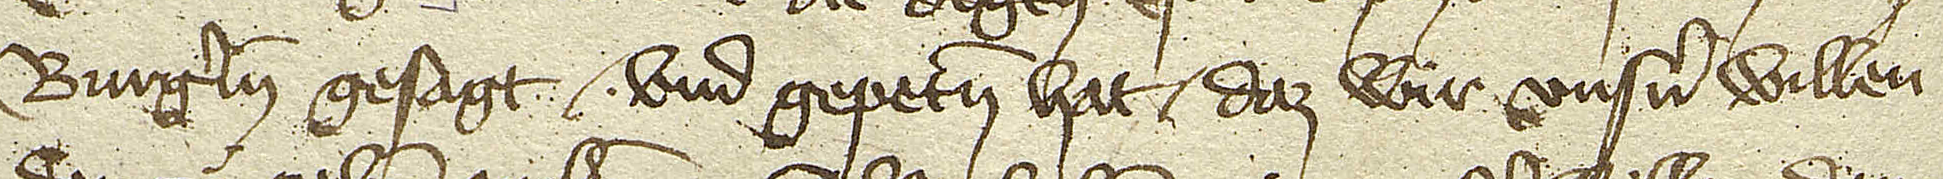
Burg*in geſagt / . vnd gepetn* hat / daʒ wir vnſn* willen
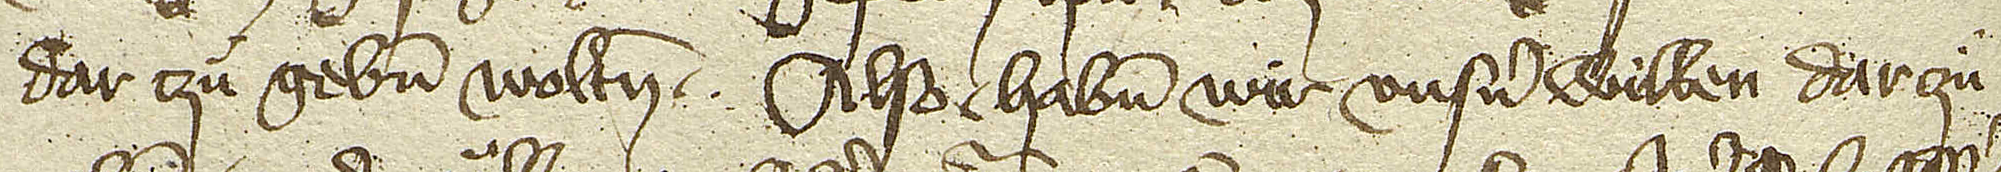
dar cʒü gebn* woltn* / . Alſo / habn* wir vnſn* willen darcʒü
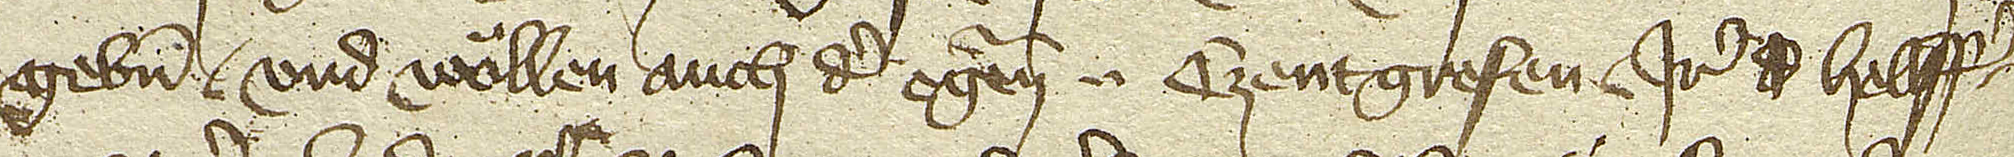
gebn* / vnd wöllen auch d* egen* ~ Cʒentgrefen / Ir* d helff* /
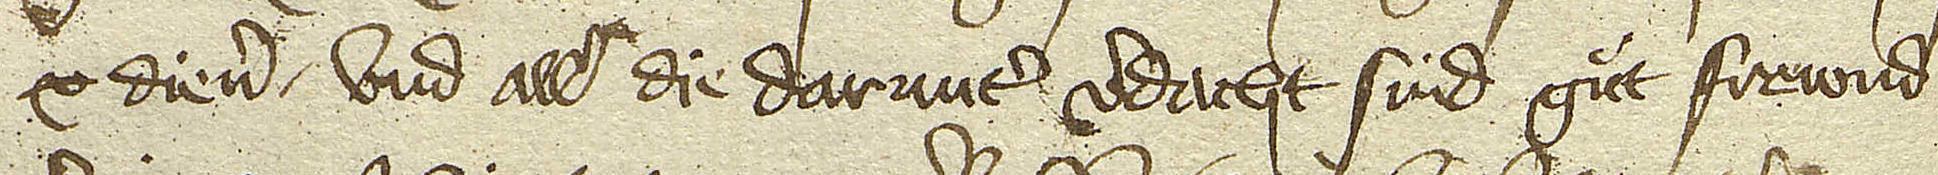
v dien* / vnd all* die darunt* v*dacht ſind güt frewnd
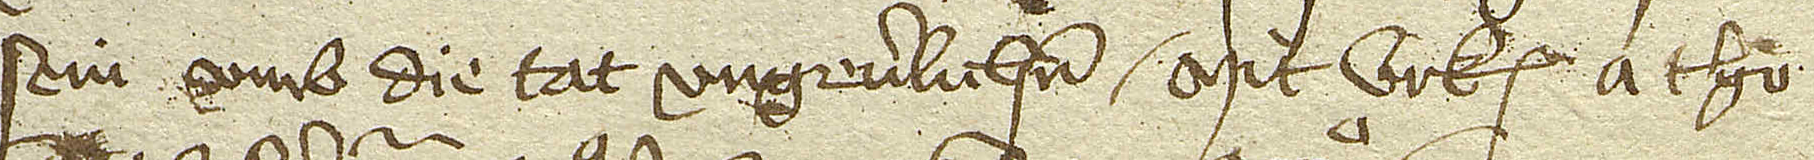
ſein vmb die tat vngeu*lichn* / Mit vrk* at*go
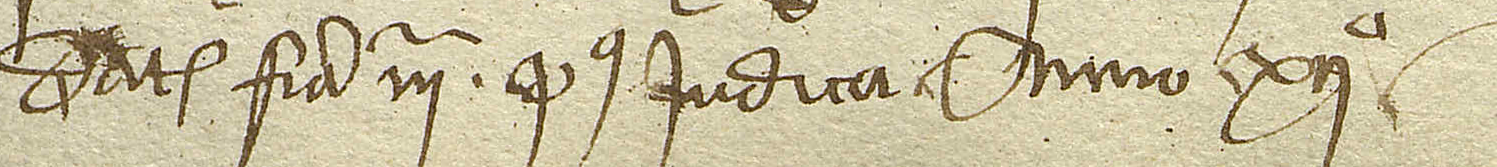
Dat* fia* iii* . p* Iudica / Anno xii* /
